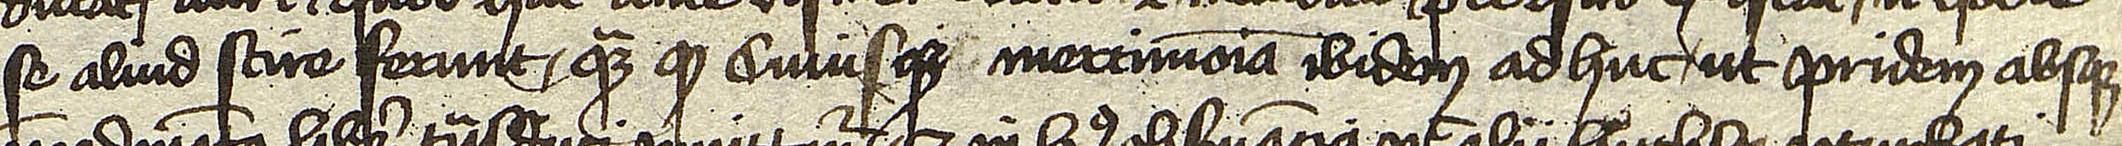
ſe aliud ſcire ferunt / q* q* Cuiuſq* mercimo*ia ibidem ad huc / ut pridem abſ*
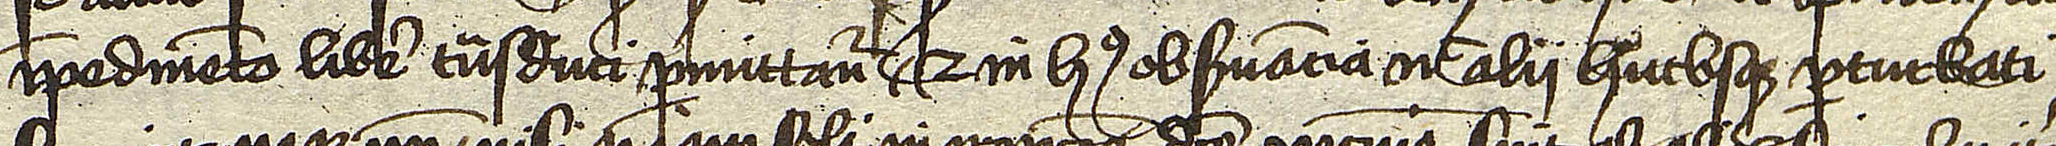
i*ped*me*to libe* t*nſduci p*mittan* / @ in h* obſ*ua*cia n* alii huiuſq* p*turbati
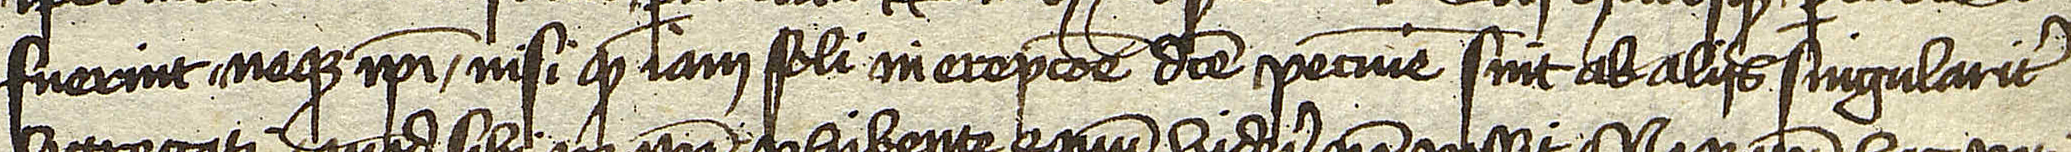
fuerint / neq* ip*i / niſi q* iam ſoli in erepc*o*e d*c*e pecu*ie ſint ab aliis ſingualit*
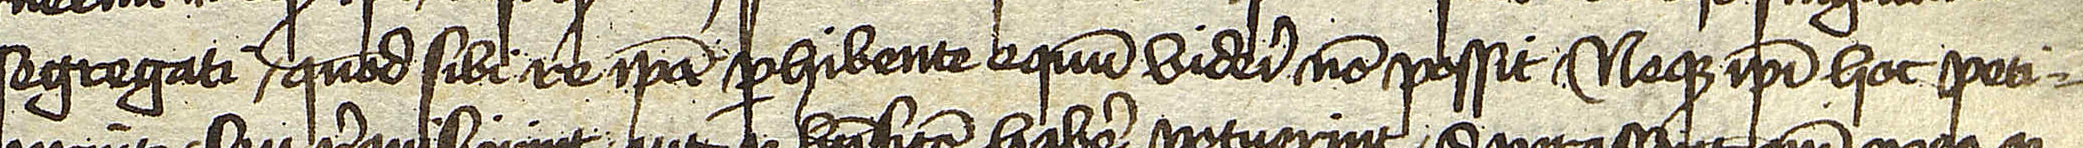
ſegregati / quod ſibi re ip*a p*hibente equu* vide* no* poſſit / Neq* ip*i hoc peti =
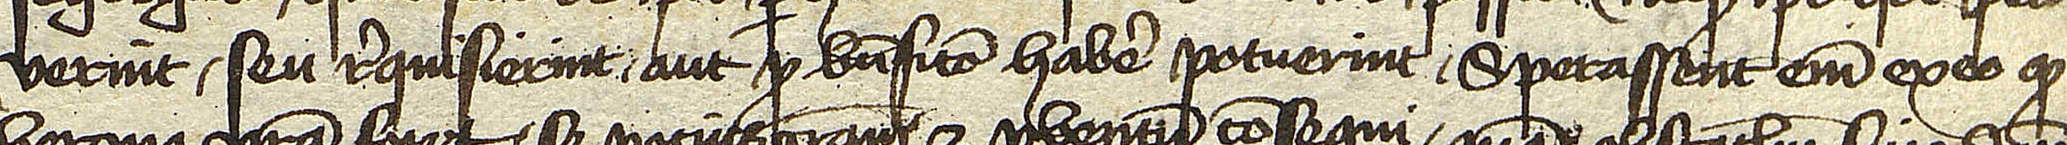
verint ſeu r*quisierint aut p* b*n*fic*o habe* potuerint. Sperassent e*m ex eo q*
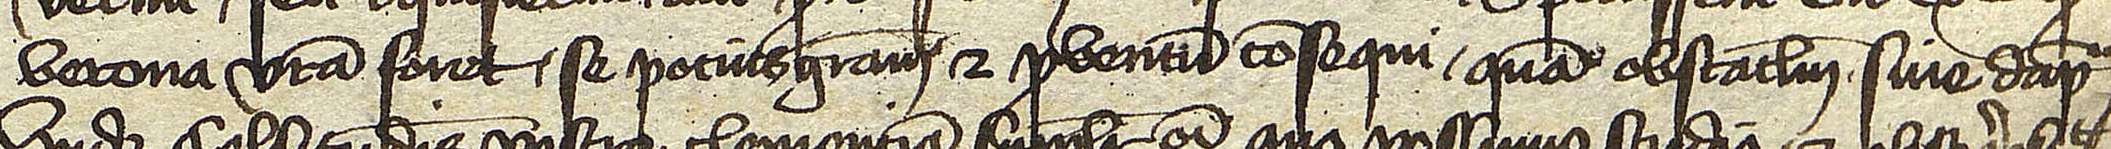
Verona v*ra foret / ſe pot*us gra*m @ p*vent* co*ſequi / qua* obſtac*l*m ſiue da*p*m
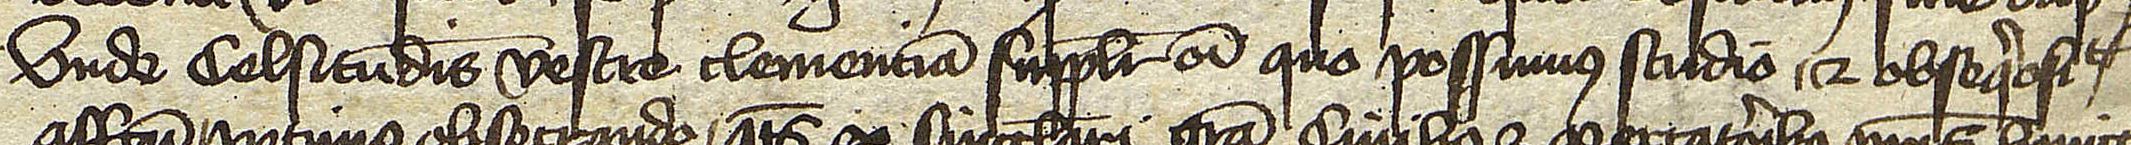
Vnde Celſitud*is veſtre clemencia* ſuppl*r o* quo poſſum* ſtudio / @ obſeq*oſi*t*
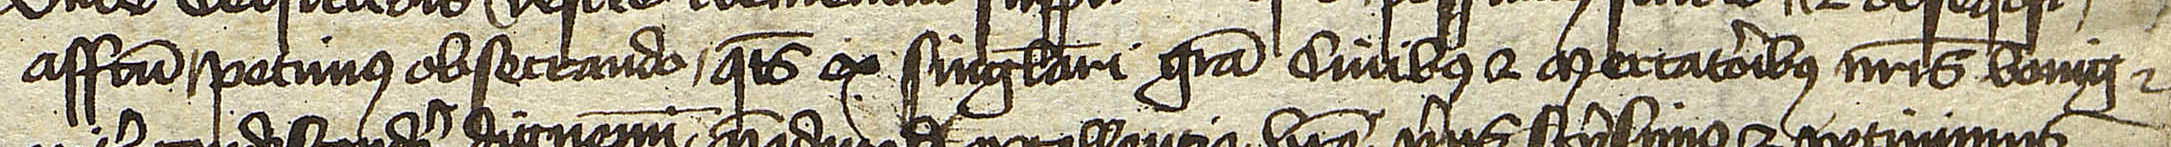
aff*c*u / petim* obſecrando / q*t*s ex ſing*lari gr*a Ciuib* @ Mercato*ib* n*ris benig =
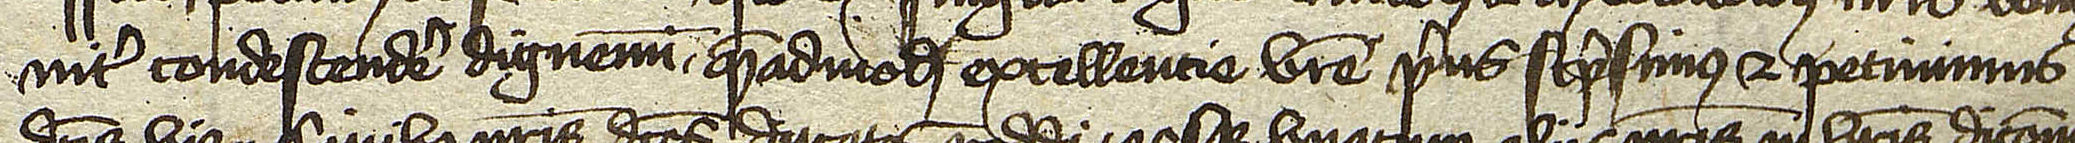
nit* condeſcende* dignemi* / q*admod* excellencie v*re p*ns ſc*pſim* @ petiuimus
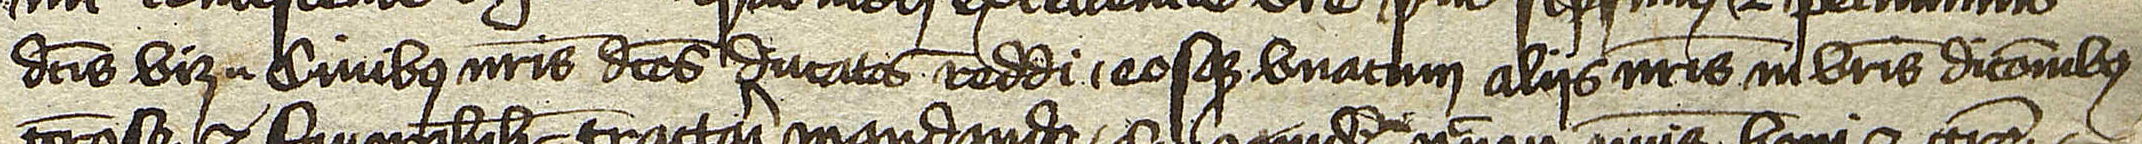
d*tus vi*c* ~ Ciuib* n*ris d*tos ducatos reddi / eoſq* vnacum aliis n*ris in v*ris dic*onib*
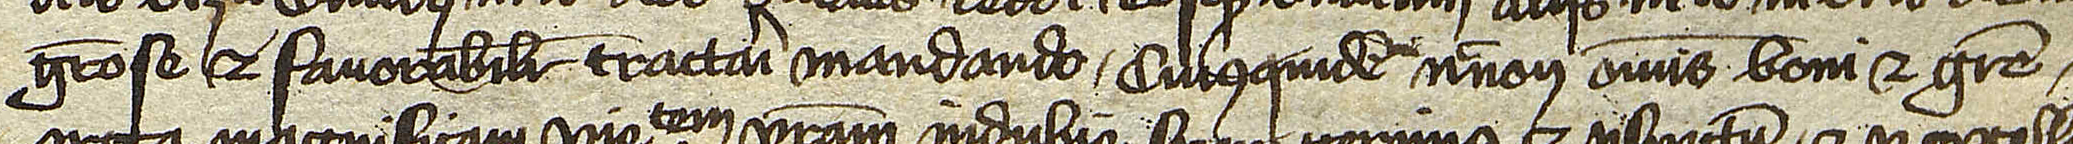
gr*oſe @ fauorabil*r tracta* mandando / Cui* quide* n*non om*is boni @ gr*e /
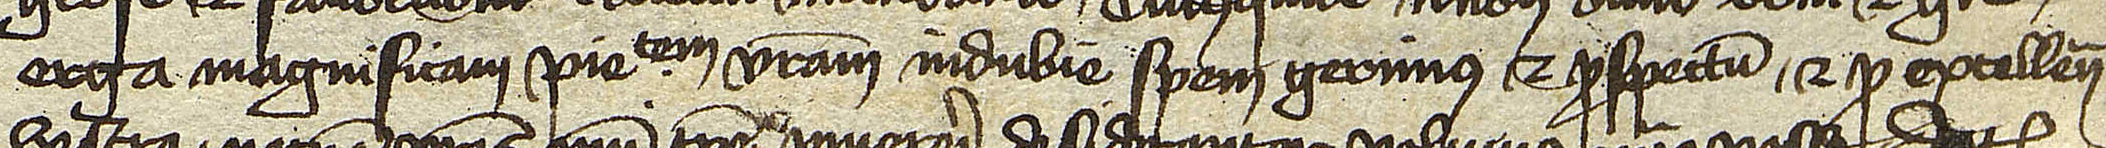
erga magnificam pie*tem . v*ram indubie ſpem gerim* @ p*ſpectu* / @ p* excellen*
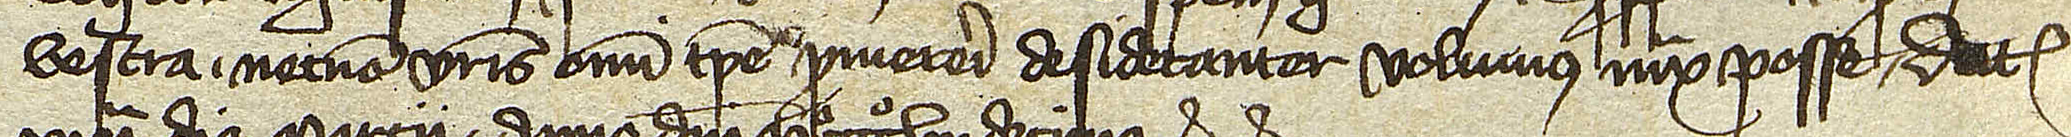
veſtra / necno* v*ris om*i t*p*e p*mere*i deſideranter volum* iux* poſſe / Dat*
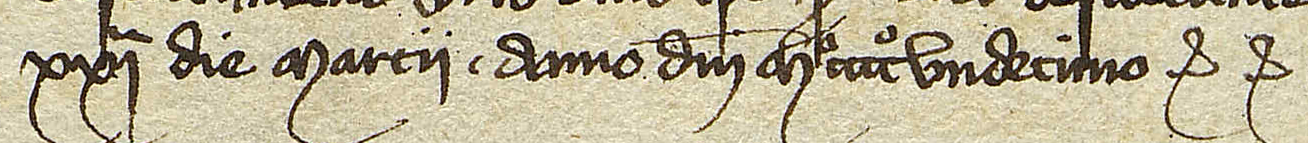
xxi die Martii / Anno d*ni M*cccc*vndecimo § §
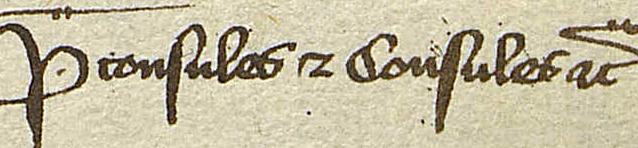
P*conſules @ Conſules ac*
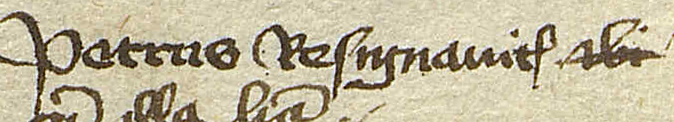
Petrus Reſignauit* ibi
